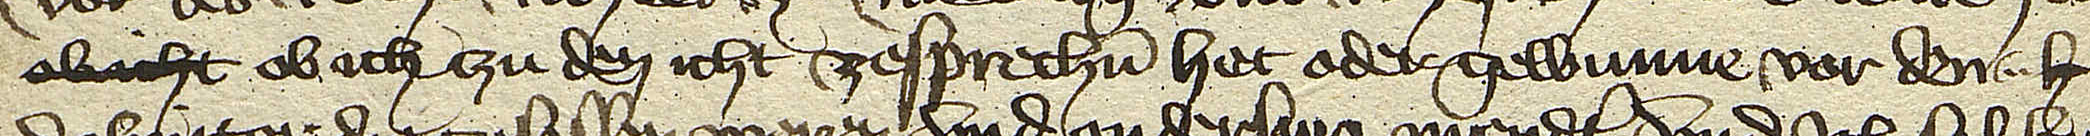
ob icht ob ich cʒu den icht cʒeſprechn* het oder gewunne vor den / ~ h
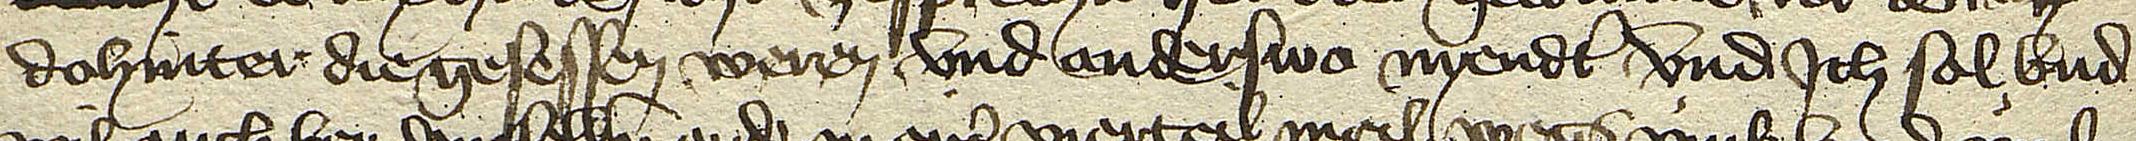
dohinter die geſeſſen weren / vnd anderſwo nyendt* / vnd Ich ſol vnd
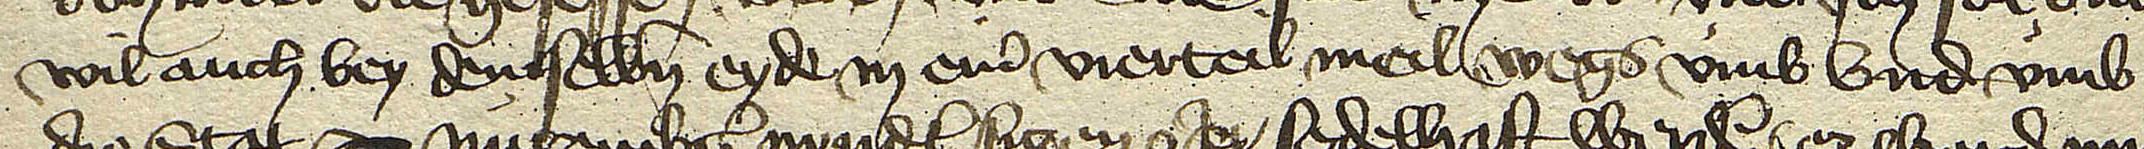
wil auch bey denſelbn* eyde in ein* vierteil meil wegs v̈mb vnd v̈mb
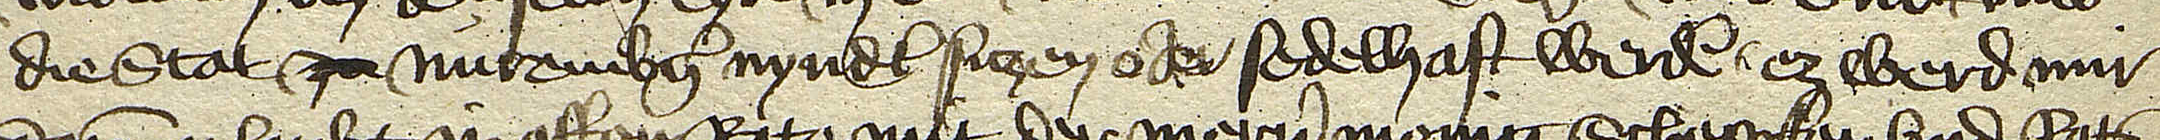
die Stat cʒu Nürembg* nynd* ſicʒen oder ſedelhaft werde* / eʒ werd mir
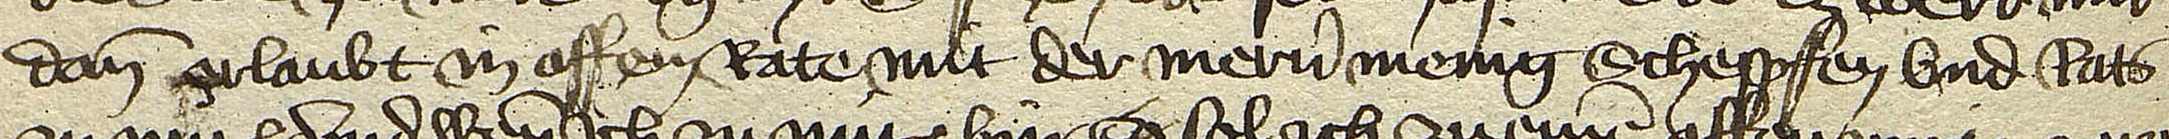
dan* erlaubt in offen Rate mit der mern* menig Scheppfen vnd Rats
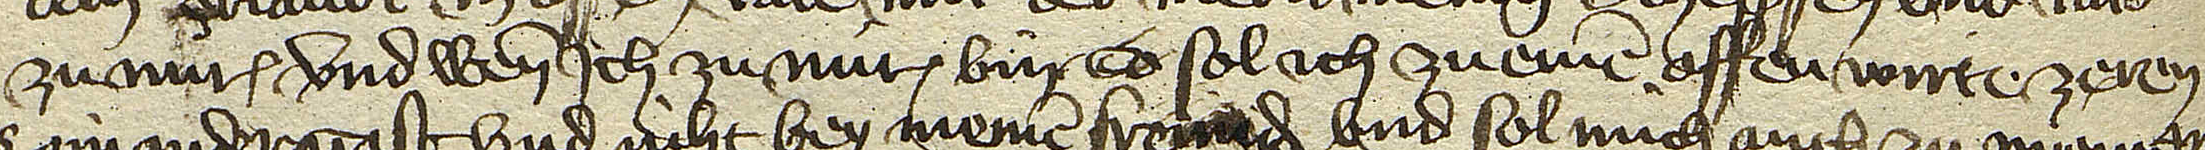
cʒ Nür* / vnd wen* ich cʒu Nür* bin / So ſol ich cʒu eine* offen wirte cʒeren
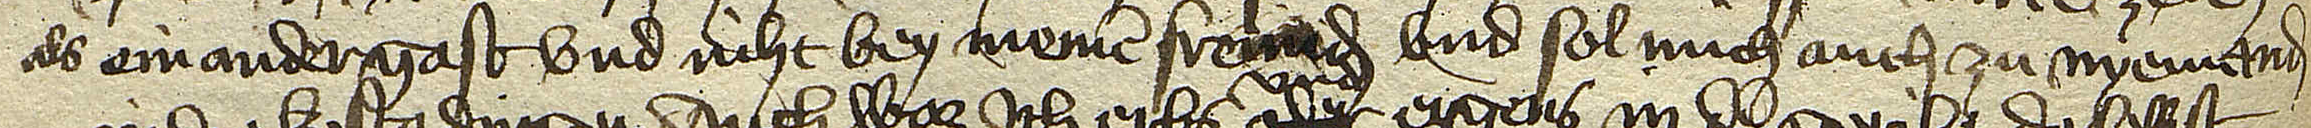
als ein ander gaſt vnd niht bey meine* freund* vnd ſol mich auch cʒu nyemand*
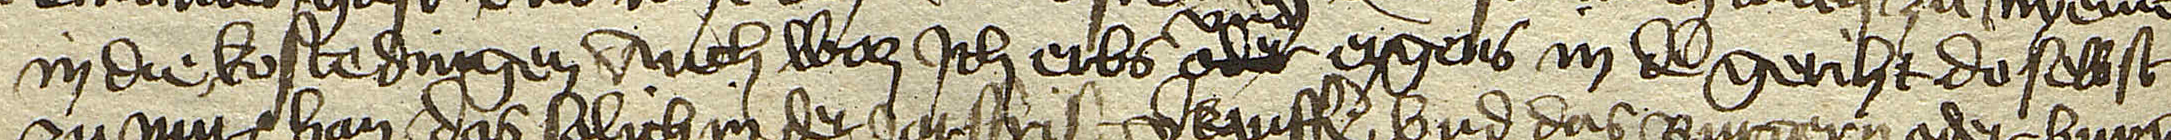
in die koſtedingen Auch waʒ Ich erbs oder eygens in d* geriht do ſelbſt
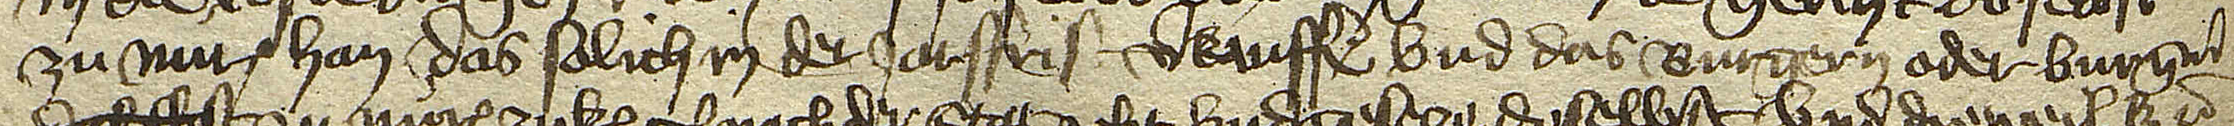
cʒu nur* han / das ſolich in der Iarſfriſt v*kauffe* vnd das Burgern oder burgin*
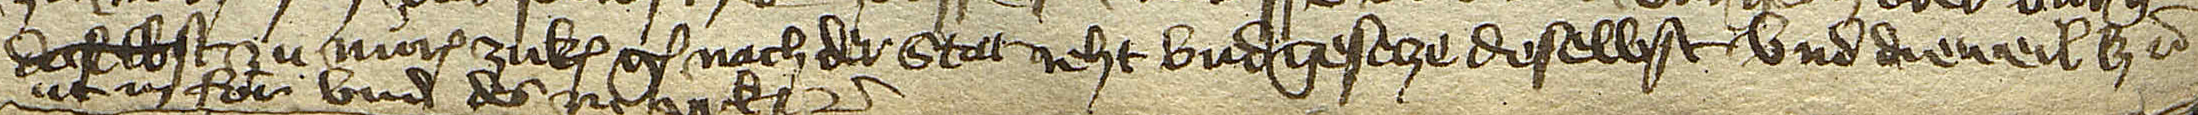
derſelbſt cʒu Nür* cʒuk* g* nach der Stat reht vnd geſecʒe doſelbſt / vnd dieweil Eʒ ec*
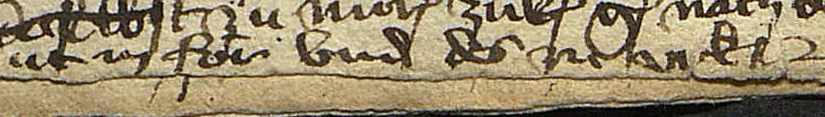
ut in for* vnd des in vrk* ec*
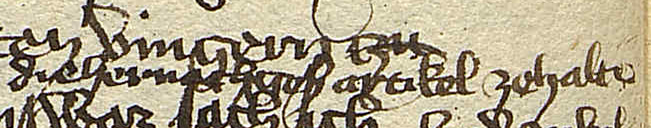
die hernach geſ* artikel cʒehalte
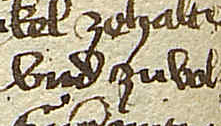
vnd cʒu vol
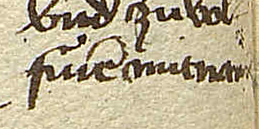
füre* mitname*
